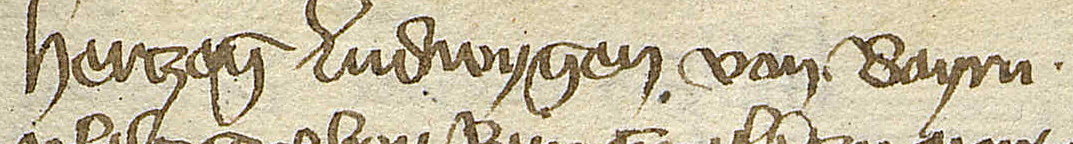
Hercʒog* Ludwygen von Bayrn .
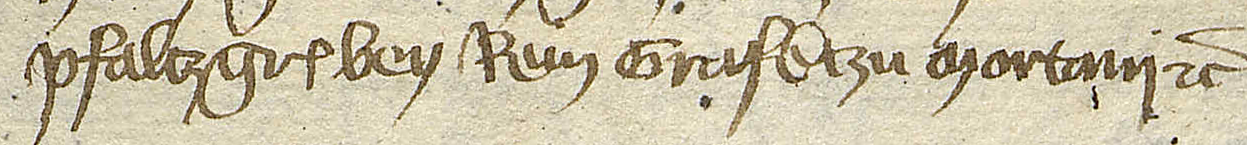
pfalcʒgr* bey Rein Grafe* cʒu Mortani ec*
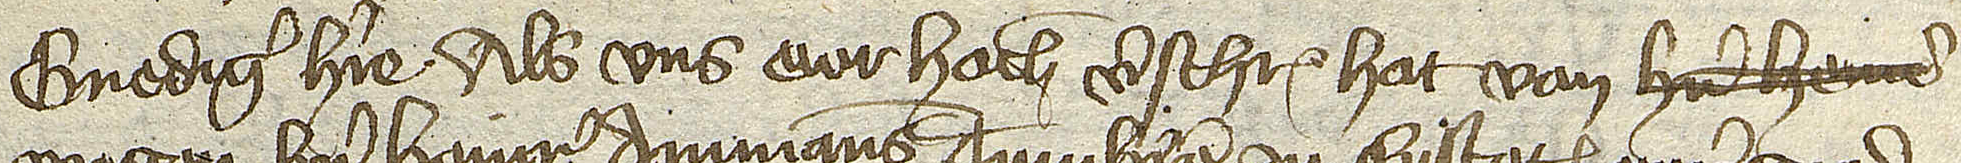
Gnedig* h*re . Als vns ewr hoch* v*ſchr* hat von hn* heinr*
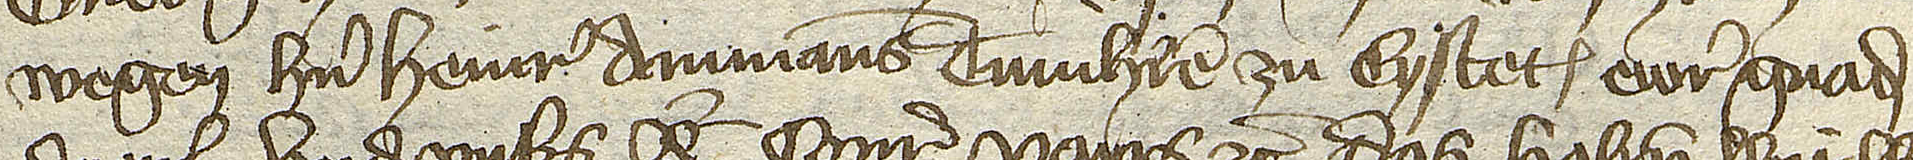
wegen hn* heinr* Amman*s Tumhre* cʒu Eyſtet* ewr* gnad*
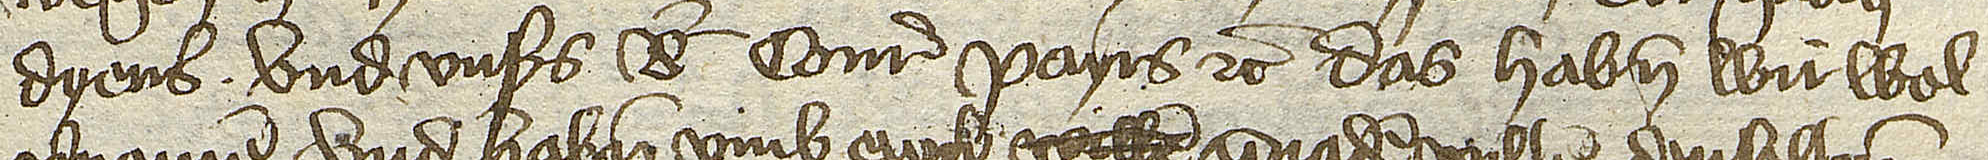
dyens* . vnd vnſ*s B* Conr* payrs ec* das habn* wir wol
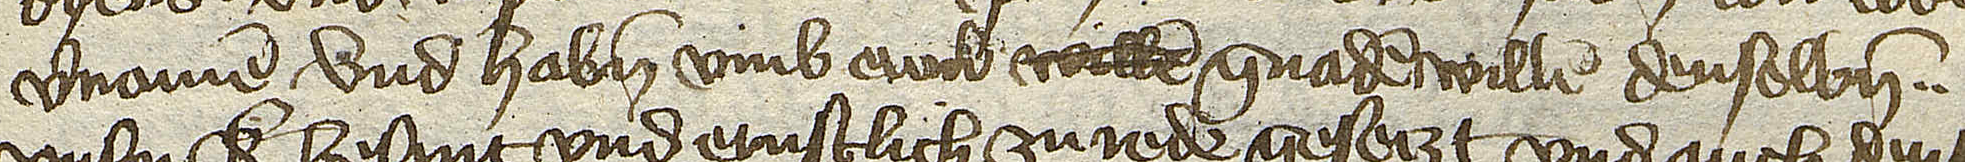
v*nome* / vnd habn* vmb ewn* wille* gnade* wille* denſelbn* ~
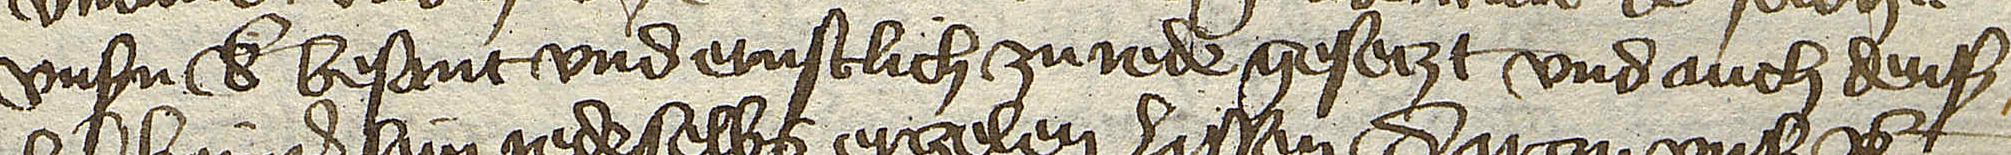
vnſ*n B* beſant vnd ernſtlich cʒu rede geſecʒt vnd auch denſ*
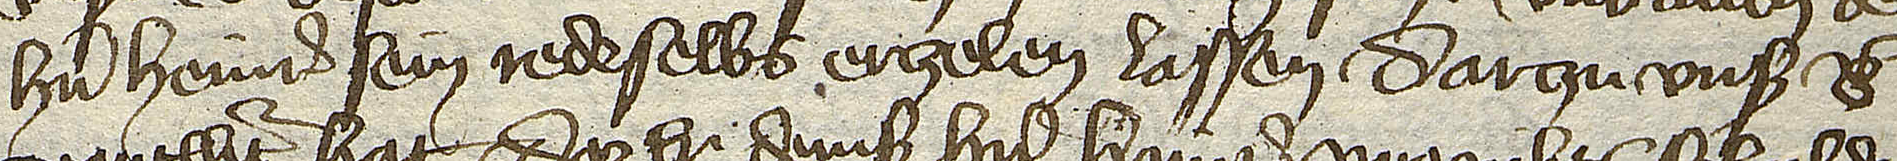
hn* heinr* ſein redeſelbs ercʒelen laſſen / Darcʒu vnſ* B*
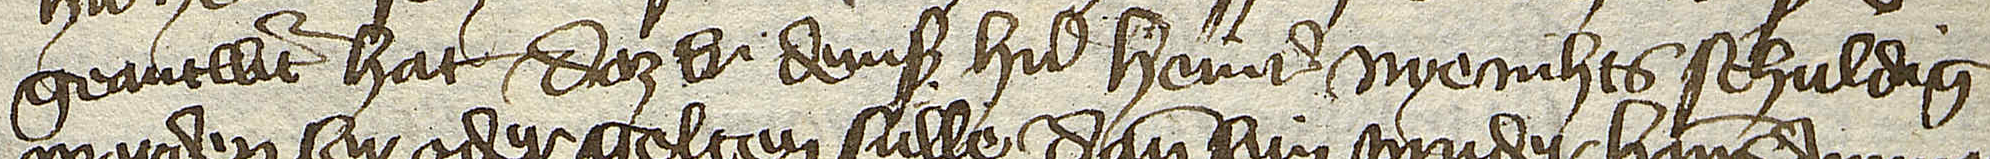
geantw*t hat / Daʒ Er demſ* hn* heinr* nye nihts ſchuldig
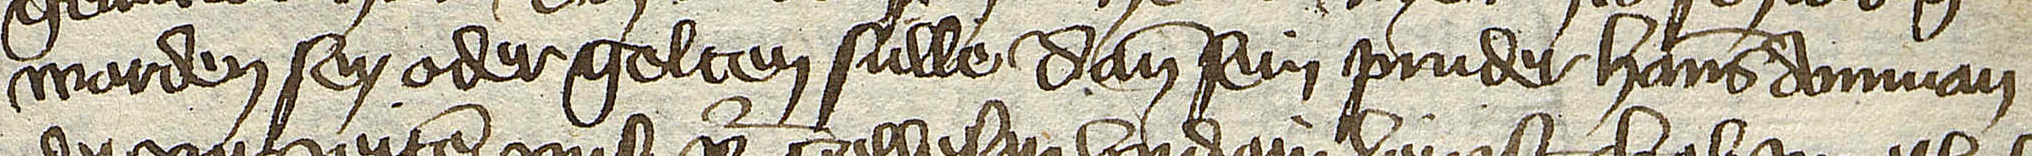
worden ſey oder gelten ſülle / dan* ſein pruder han*s Amman
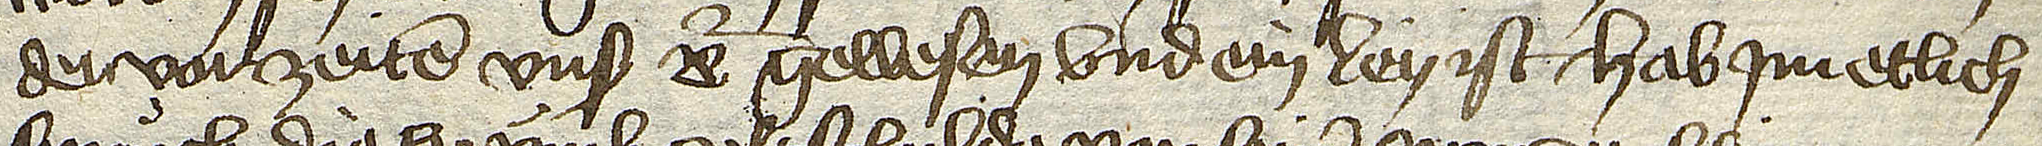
der vor cʒeite* vnſ* B* geweſen vnd ein ley iſt / hab Im etlich
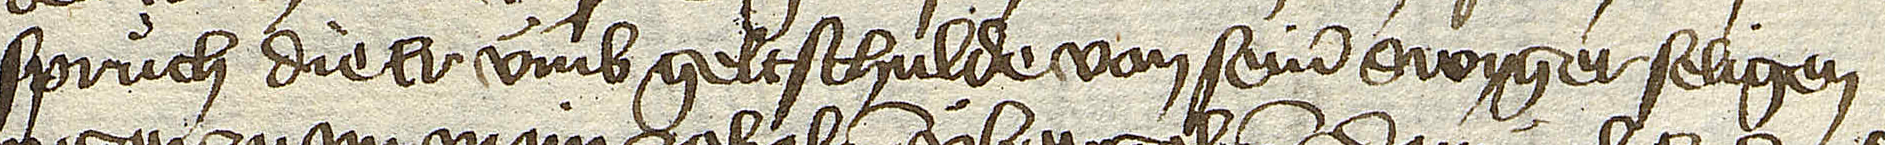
ſprüch die Er v̈mb geltſchulde von ſein* Swyger ſeligen
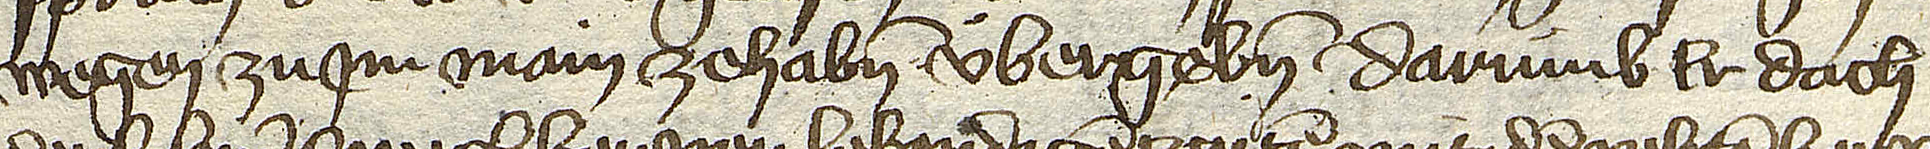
wegen cʒu Im main cʒehabn* v̈bergebn* / darümb Er doch
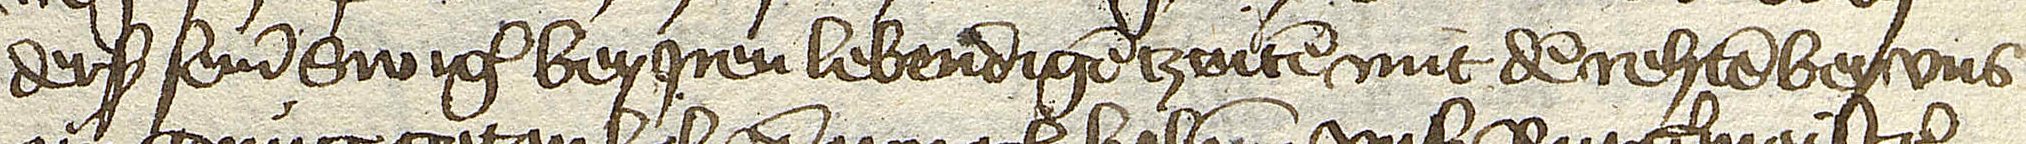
derſ* ſein* Swig* bey Iren lebendige* cʒeite* mit d* rehte* bey vns
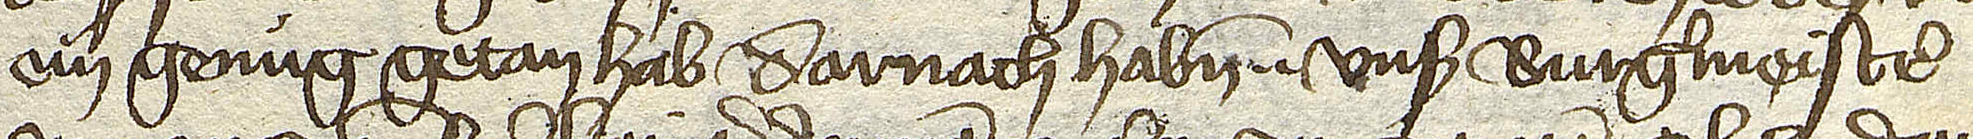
ein genüg getan hab / Darnach habn* ~ vnſ* Burg*meiſte*
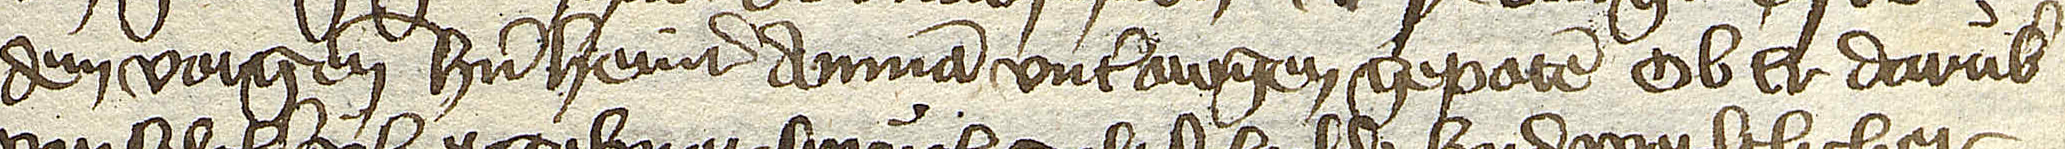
dem vorgen* hn* heinr* Amma* vnt*awgen gepote* Ob Er darüb*
